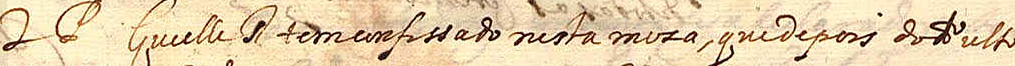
2 P Que elle R tem confessado nesta meza, que depois do d̄o ulto
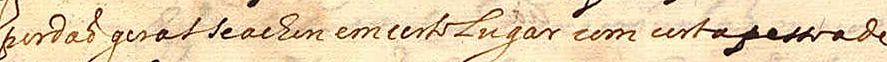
perdaõ geral se achou em certo Lugar com certa pessoa de
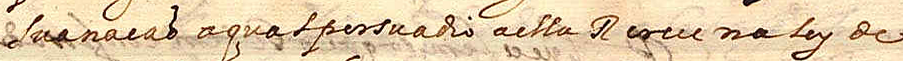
sua nacaõ a qual persuadio a ella R crece na ley de
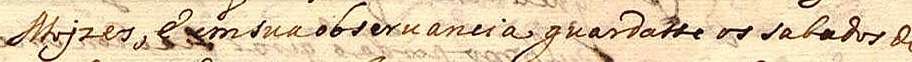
Mojzes, E em sua obseruancia guardasse os sabados de
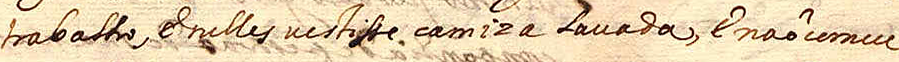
trabalho, E nelles uestisse camiza Lauada, E naõ comece
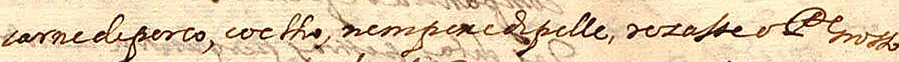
carne de porco, coelho, nem pexe de pelle, rezasse o Pe nosso
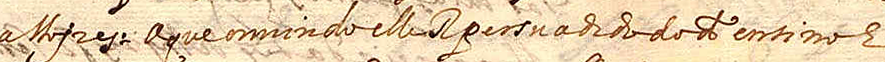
a Mojzes: O que ouuindo elle R persuadido do d̄o ensino E
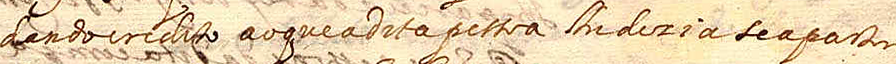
dando credito ao que a dita pessoa lhe dezia se apartou
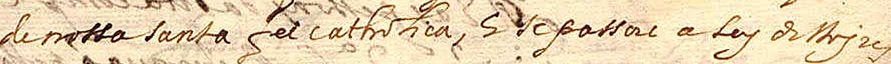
de nossa santa fee catholica, E se passou a Ley de Mojzes
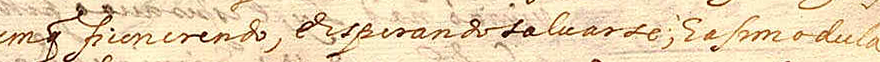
em q̄ ficou crendo, E esperando saluarse; E asim o decla
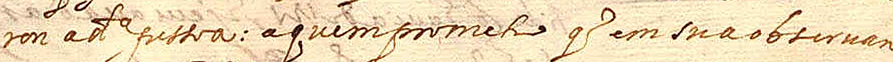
rou a d̄a pessoa: a quem prometeo q̄ em sua obseruan
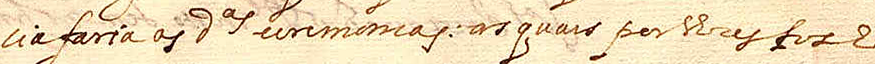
cia faria as das ceremonias: as quais por Vezes fez E
